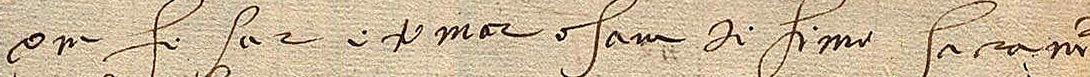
comfesar e tomar o samtisimo sacramt
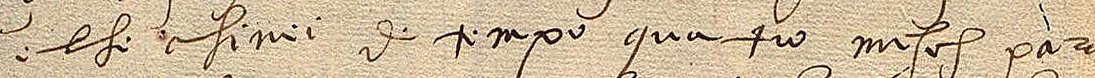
e lhe asinei de tempo quatro meses para
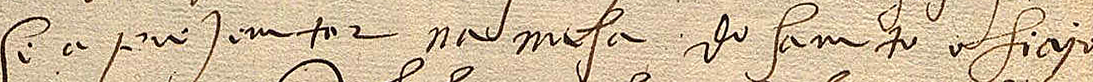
se aprezemtar na mesa do samto oficyo
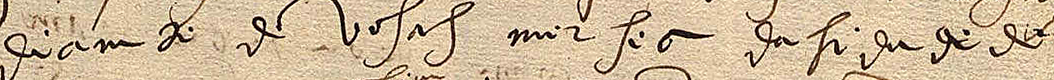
diamte de vosas merses da sidade de
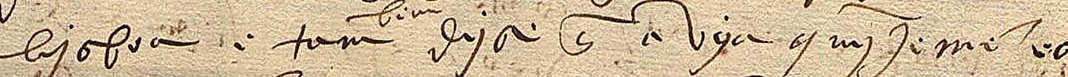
ljsboa e tambem dyse q̄ avya quȳze mezes
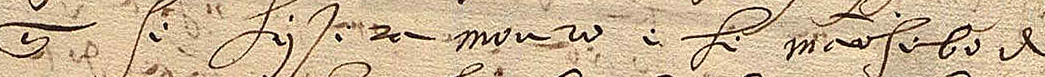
q̄ se fyzera mouro e he mãosebo de
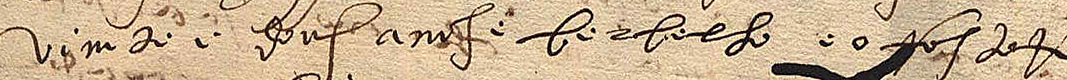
vimte e dous anos e berbelho e o Rosto Re
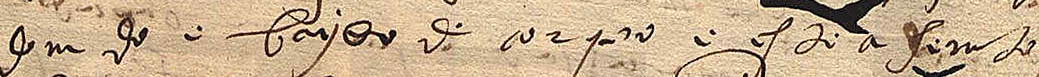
domdo e bayxo de corpo e este asemto
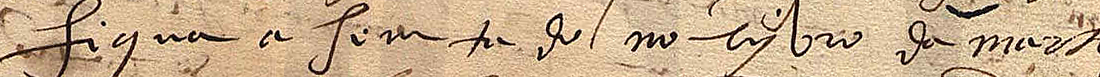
fiqua asemtado no lyvro da marti
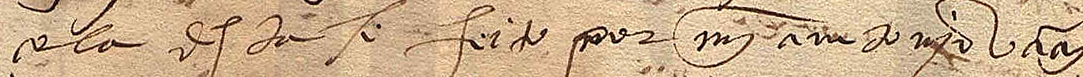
çola desta se feito por mj̄ amtonjo vaāz
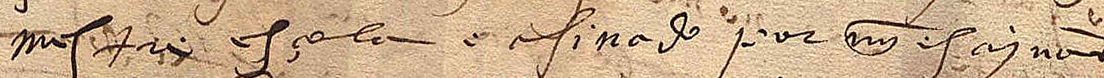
mestre escola e asinado por mj̄ escrjuão
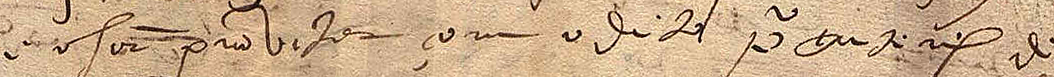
e o sor̄ provizor com o dito po guteres de
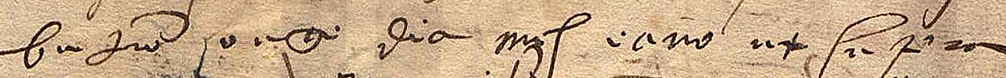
butrō ouge dia mes e ano ut supra
